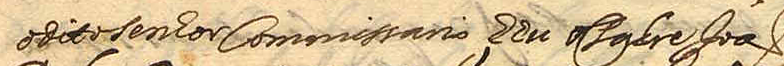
o dito senhor Commissario E Eu o Padre Joaõ
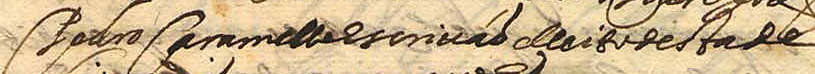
Pedro Caramello escriuaõ elleito desta de
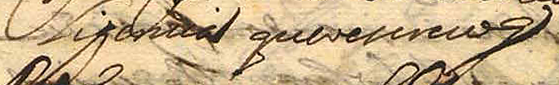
ligencia que o escreuj
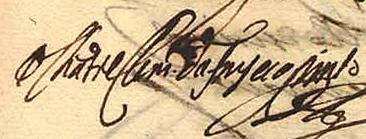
o Chātre Clem-te da Fonseca pinto
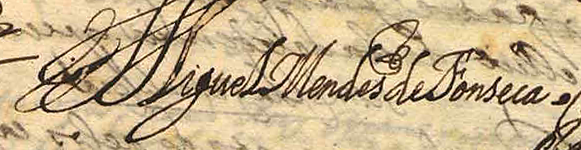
Miguel Mendes de Fonseca
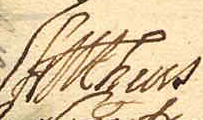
Fr M̄theus
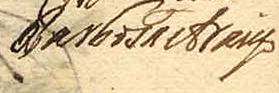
Barbosa Araujo
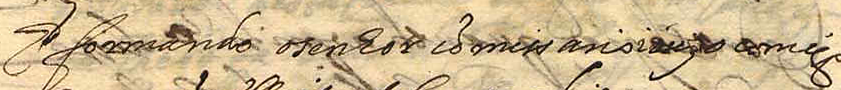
E formando o senhor cōmissario iuizo comigo
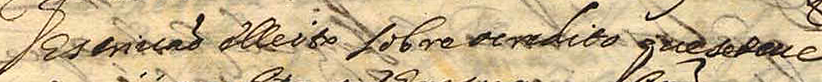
Escriuaõ elleito sobre o credito que se deue
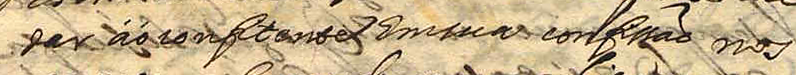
dar ao confitente Em sua confissaõ nos
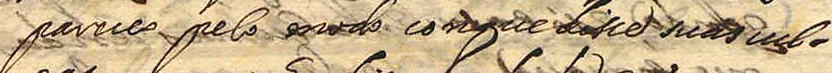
pareceo pelo modo com que disse suas cul
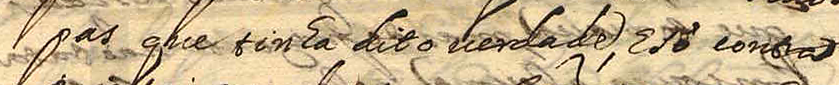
pas que tinha dito uerdade, E só contra
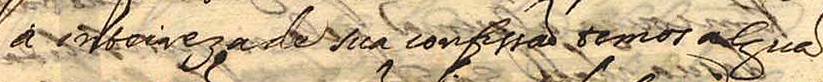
a inteireza de sua confissaõ temos alguā
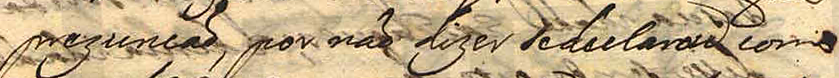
prezunçaõ, por naõ dizer se declararā com
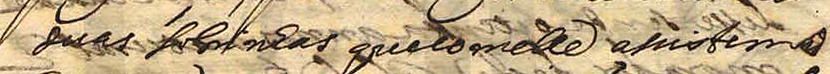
duas sobrinhas que com elle assistem
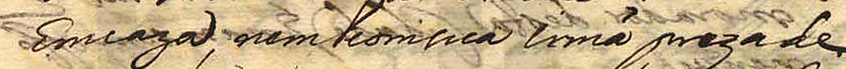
Em caza, nem com sua irmā preza de
